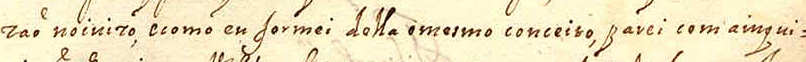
zão no iuizo, e como eu formei della o mesmo conceito, parei com a inqui
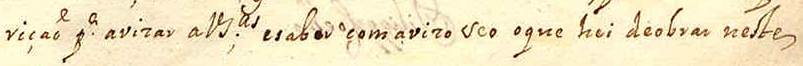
riçaõ p.a avizar a V S.as e saber com avizo seo o que hei de obrar neste
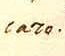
cazo.
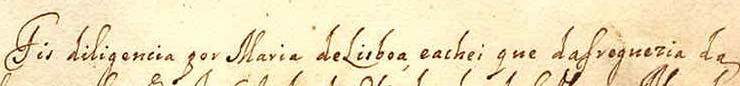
Fis diligencia por Maria de Lisboa, e achei que da freguezia de
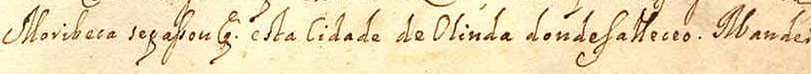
Moribeca se passou p̄.a esta Cidade de Olinda donde falleceo. Mandei
